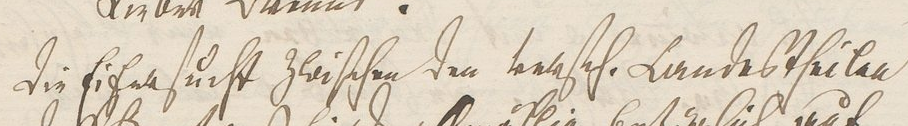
Die Eifersucht zwischen den versch. Landestheilen
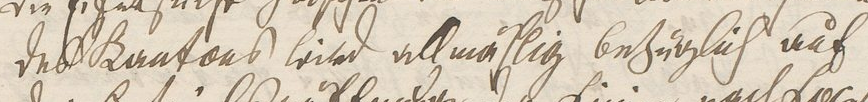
des Kantons wird allmählig bezüglich auf
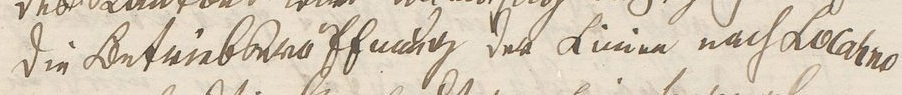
die Betriebseröffnung der Linien nach Locarno
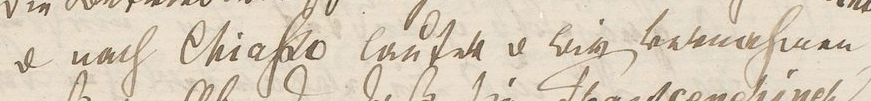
& nach Chiasso lauter & wir vernahmen
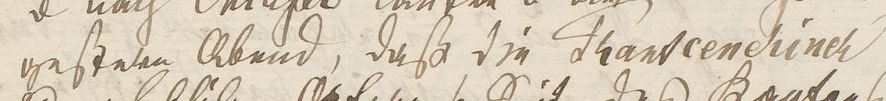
gestern Abend, daß die Transceneriner
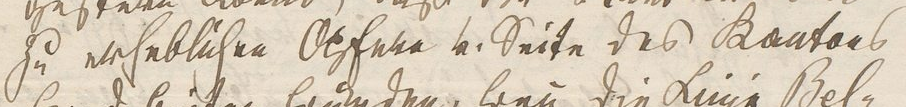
zu erheblichen Opfern v. Seite des Kantons
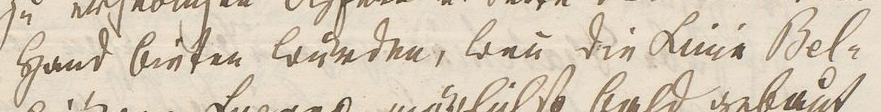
Hand bieten würden, wenn die Linie Bel-
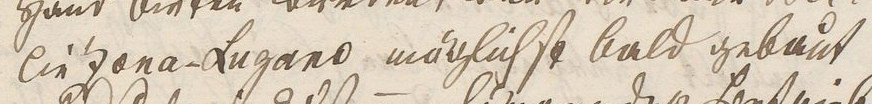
linzona – Lugano möglichst bald gebaut
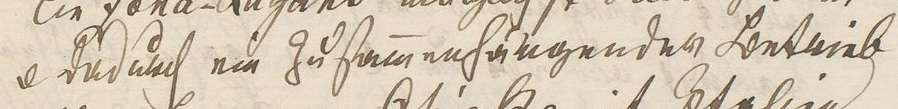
& dadurch ein zusammenhängender Betrieb
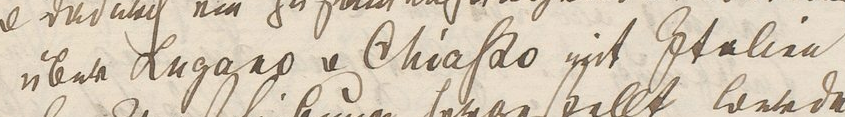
über Lugano & Chiasso mit Italien
